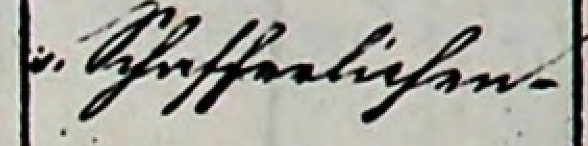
v. Schafferlichen
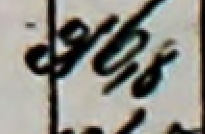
216,8
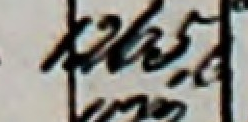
1265,6
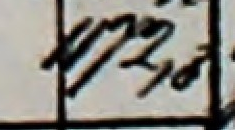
1172,8
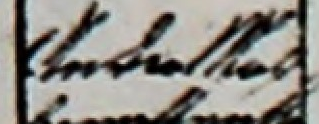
???
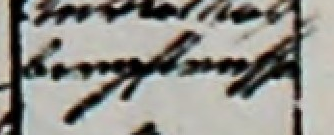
bergstrass?
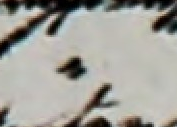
„
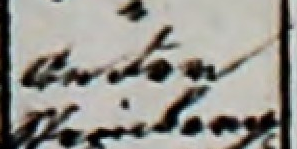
an der
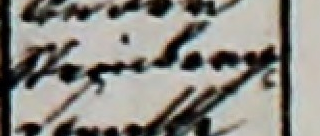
Steinberg„
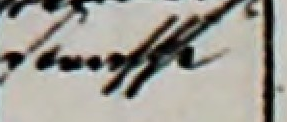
strasse
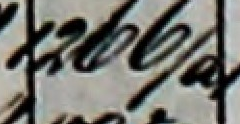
1266/a
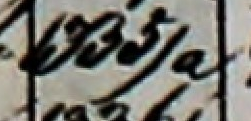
1335/a
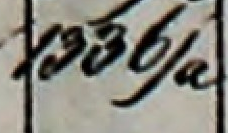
1336/a
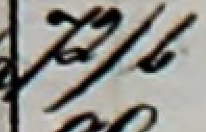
72/6
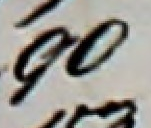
90
